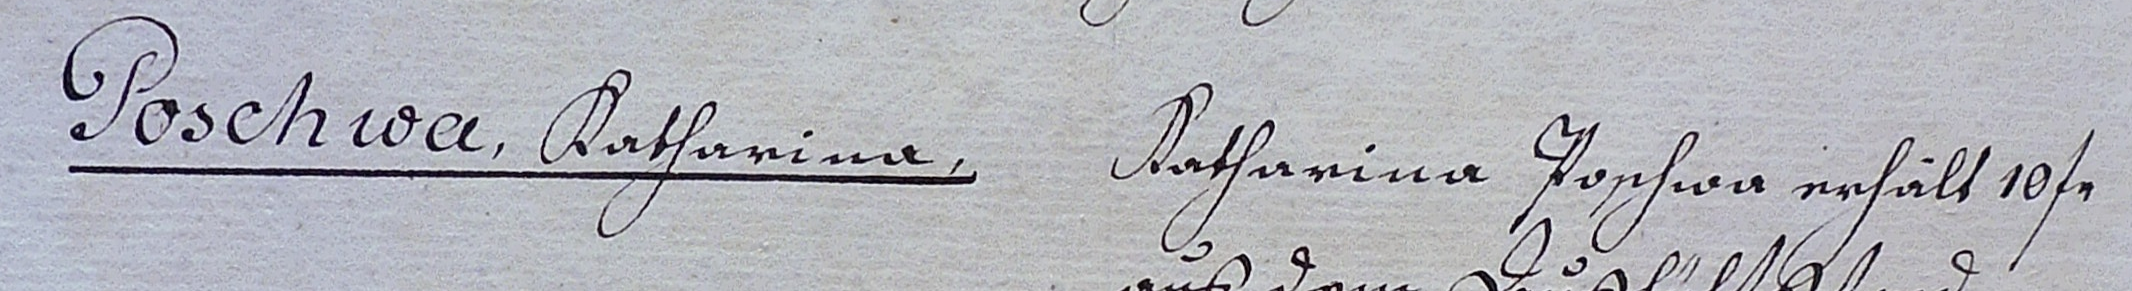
Poschwa, Katharina, Katharina Poschwa erhält 10fr.
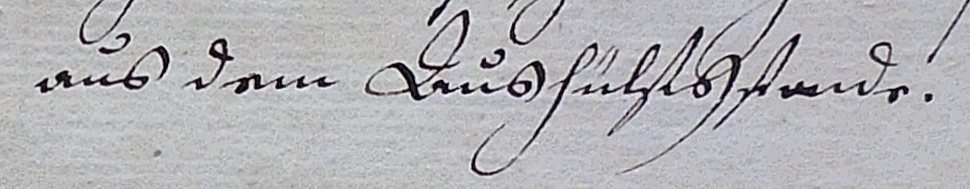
aus dem Aushülfsfonde.
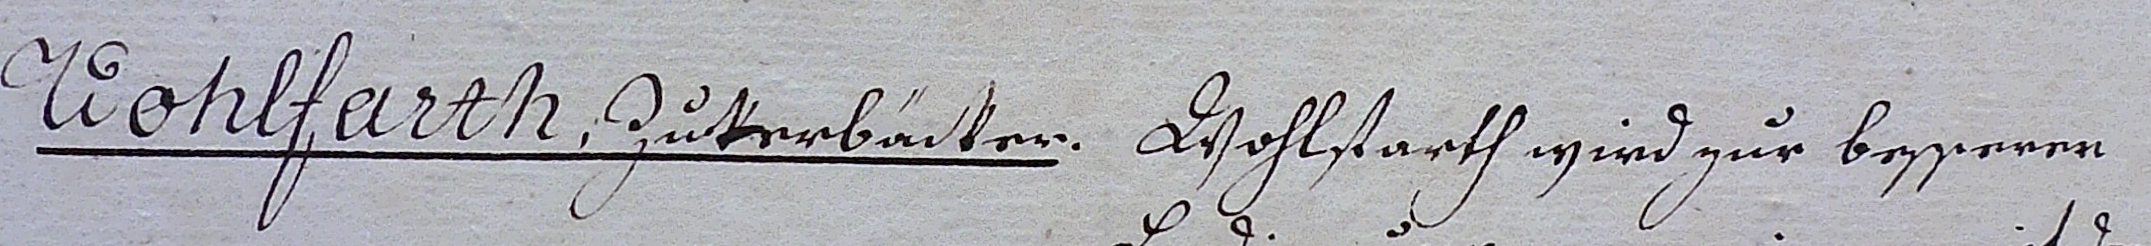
Wohlfarth, Zuckerbäcker. Wohlfarth wird zur besseren
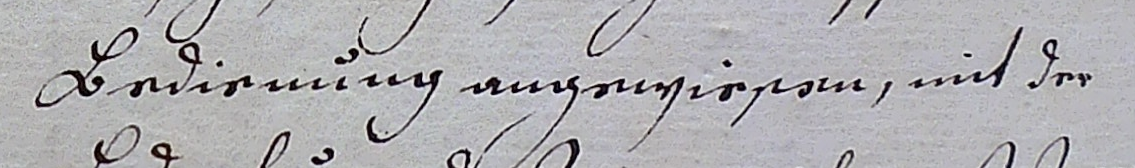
Bdienung angewiesen, mit der
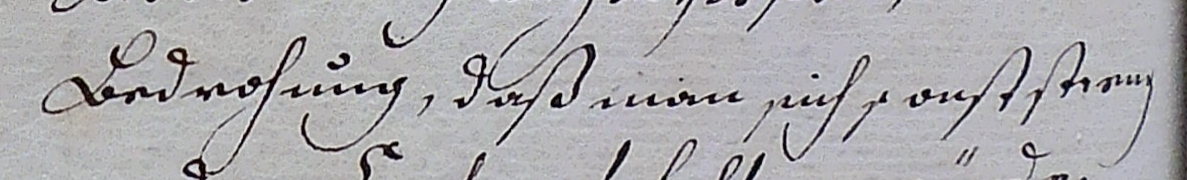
Bedrohung, daß man sich sonst streng
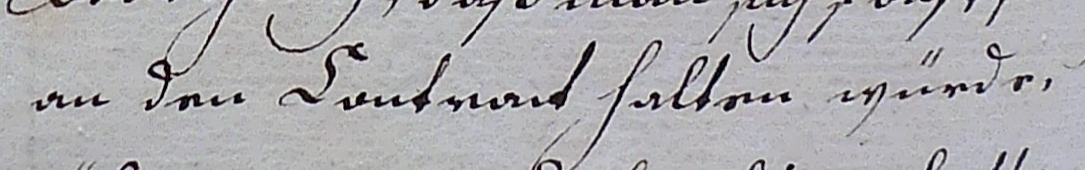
an den Contract halten würde,
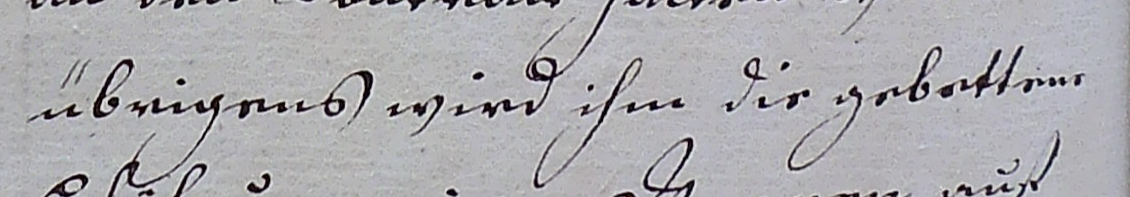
übrigens wird ihm die gebettene
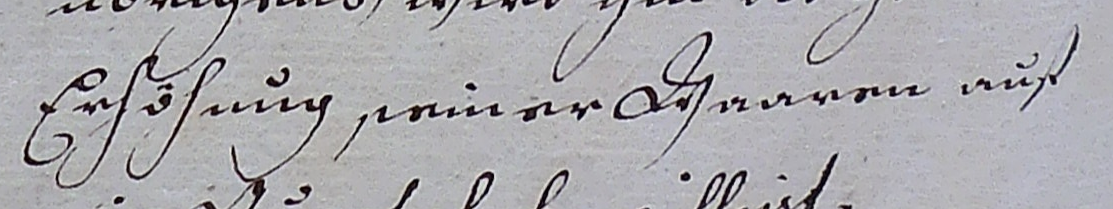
Erhöhung, seiner Waaren auf
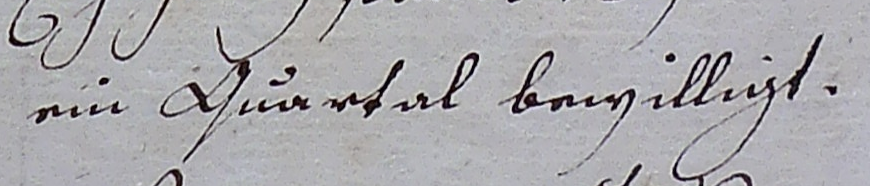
ein Quartal bewilligt.
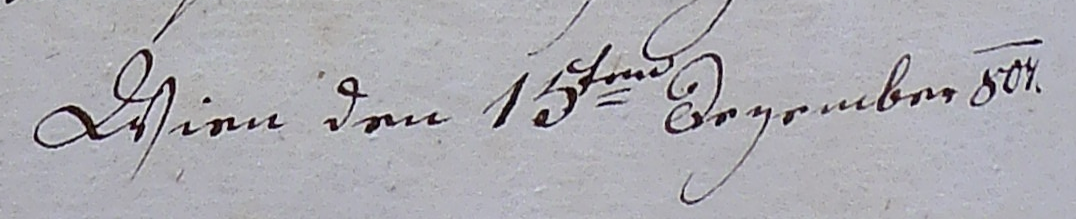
Wien den 15te͇n Dezember 8͞0͞7.
